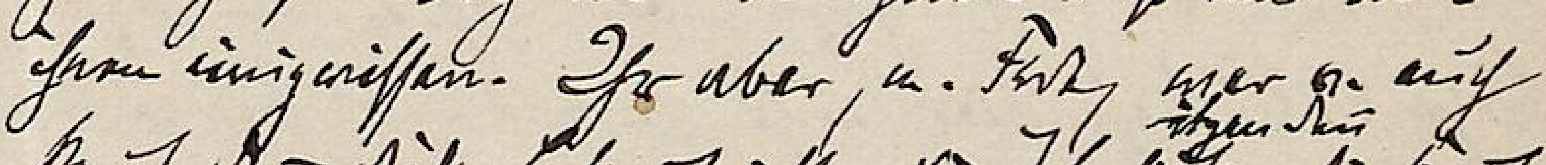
ihnen einigwissen. Ihr aber, m. Frde., wer v. euch
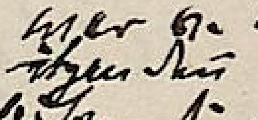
ihnen den
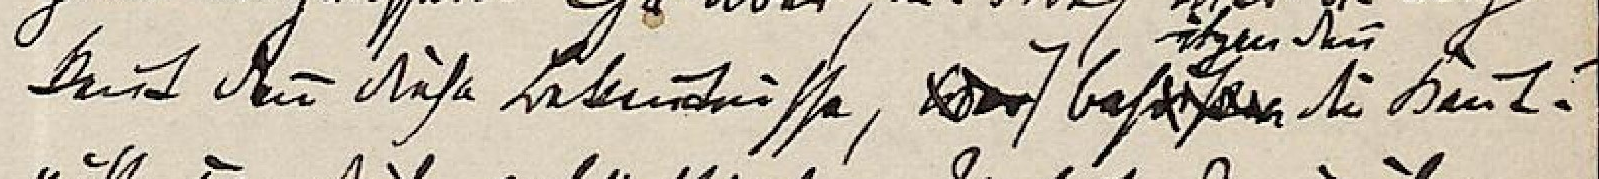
kent den diese Bekentnisse, wer ] beförd die Kent¬
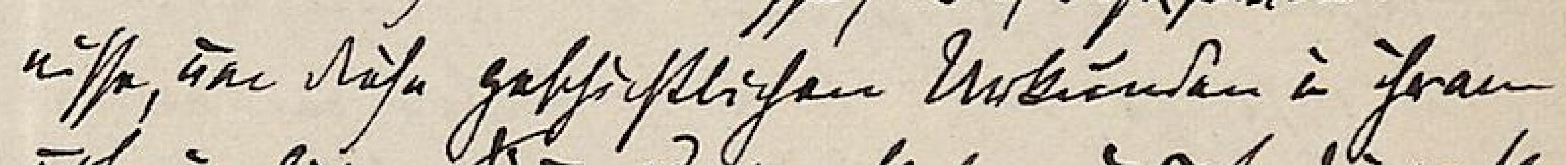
nisse, um diese geschichtlichen Urkunden in ihrem
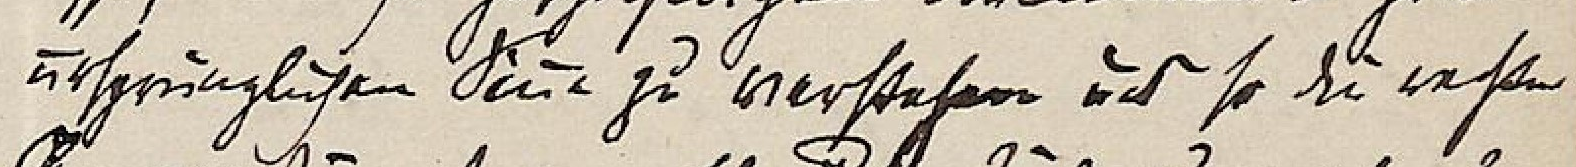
ursprünglichen Sine zu verstehen und so die rechte
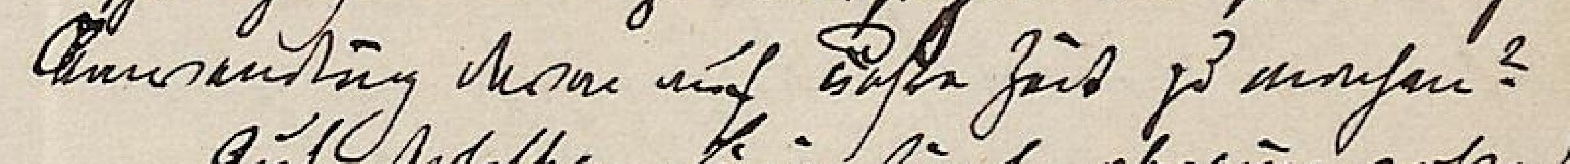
Anwendung davon auf unsere Zeit zu machen?
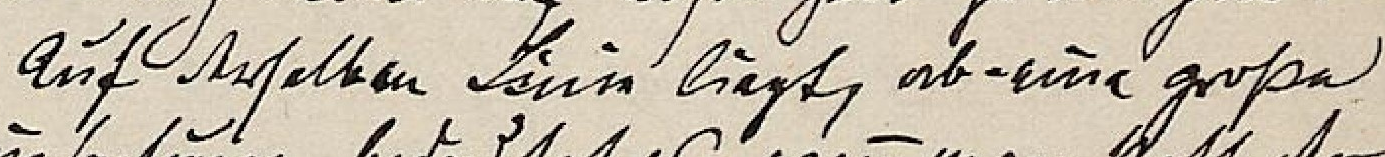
Auf derselben Linie liegt, ab eine großen
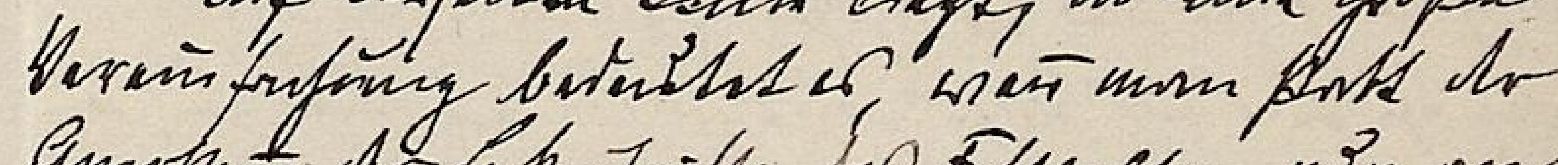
Vereinfachung bedeutet es, wen man statt der
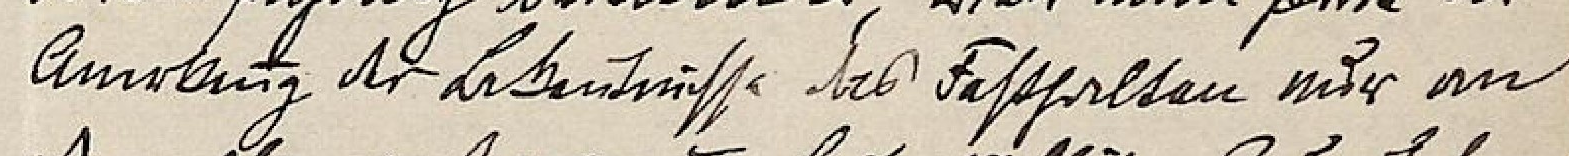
Anerkeng. der Bekenntnisse das Festhalten nur an
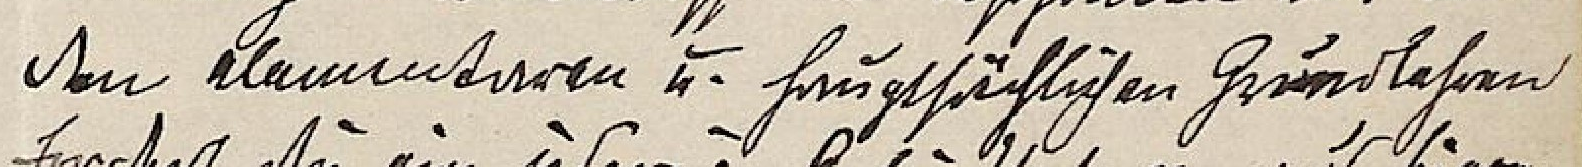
den elementaren um. hauptsächlichen Grundlehren
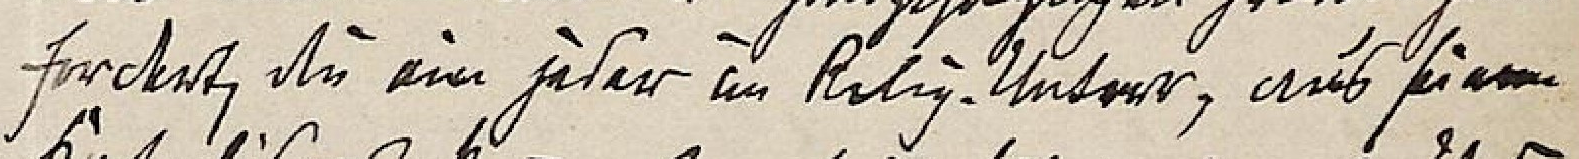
fordert, die ein jeder in Relig.Unterr., aus seinem
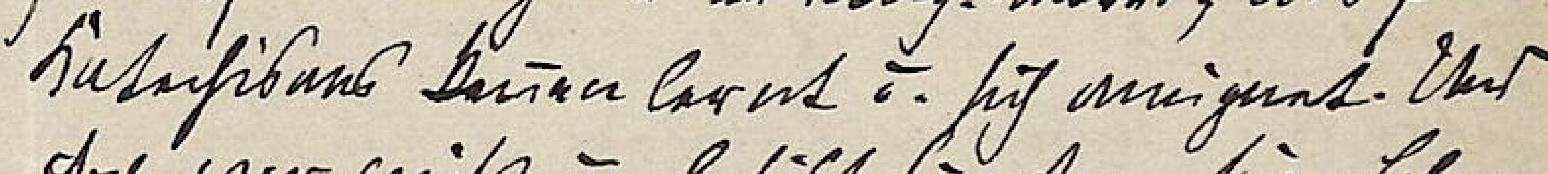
Katechismus kennenlernt u. aneignet. Und
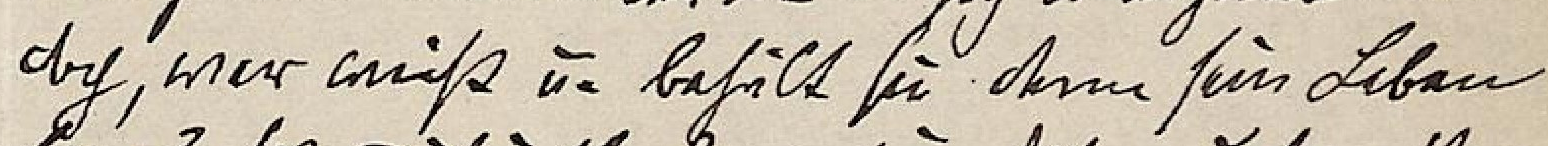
doch, wer weicht u. behält sie denn sein Leben
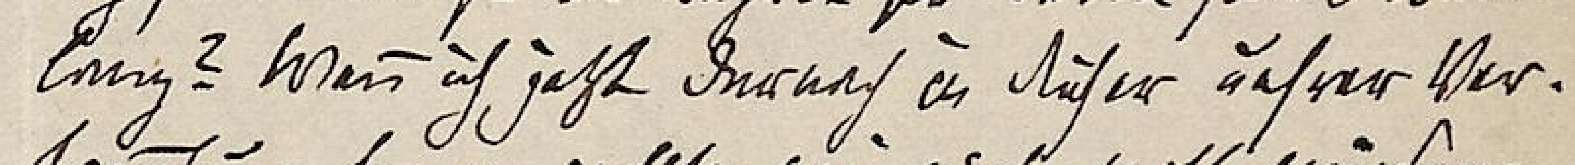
lang? Wen ich jetzt danach in dieser unsrer Ver¬
